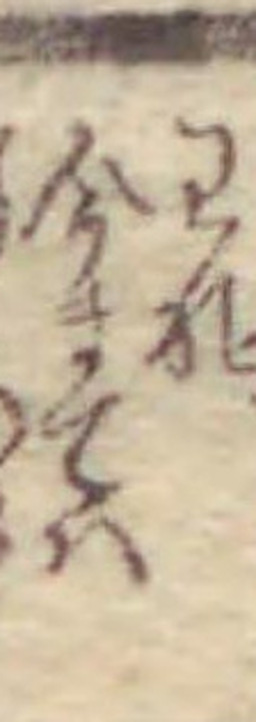今まては
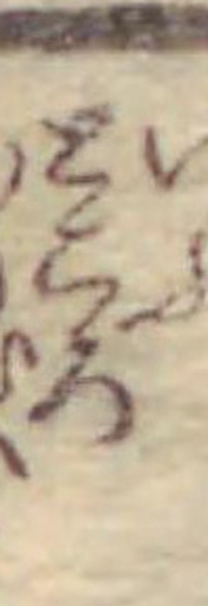ところ
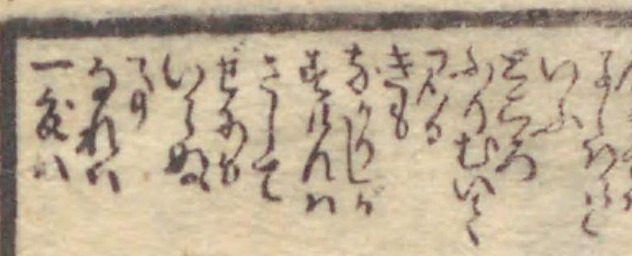なれは
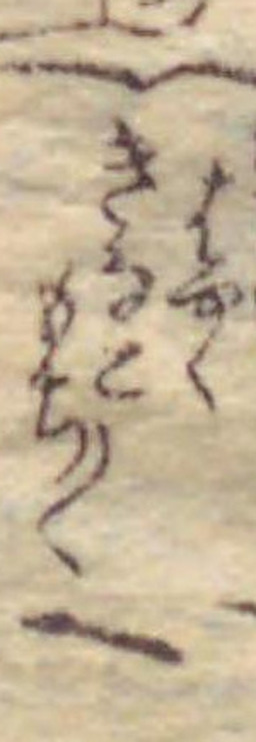きなこ
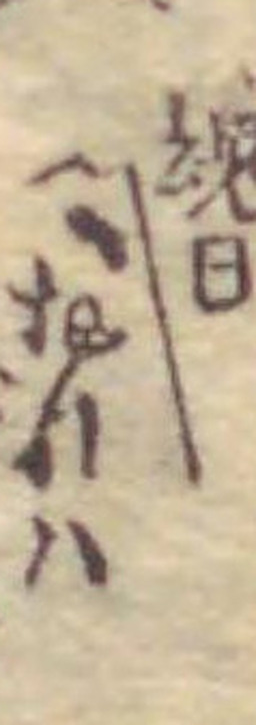〽おれは
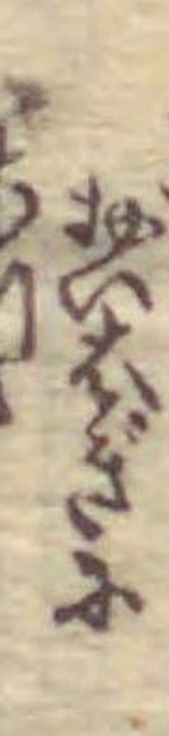おいはぎに
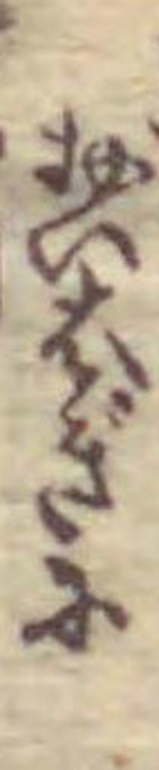おいはぎに
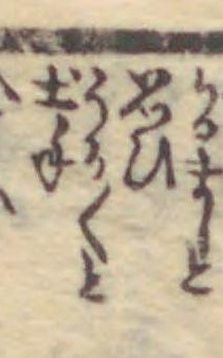うか〳〵と
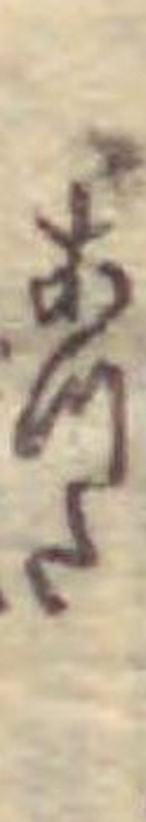あつた
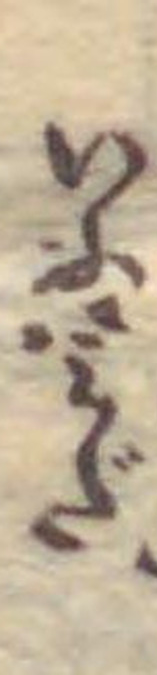いふみだ
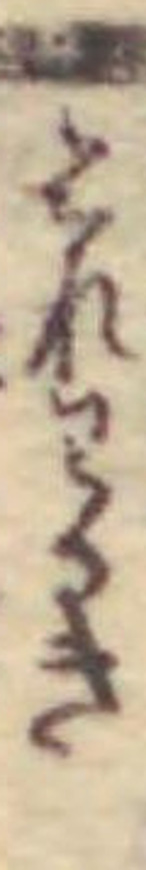これわるき
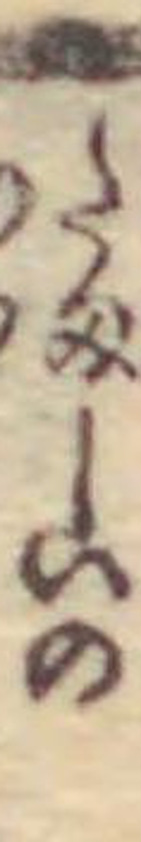たましいの
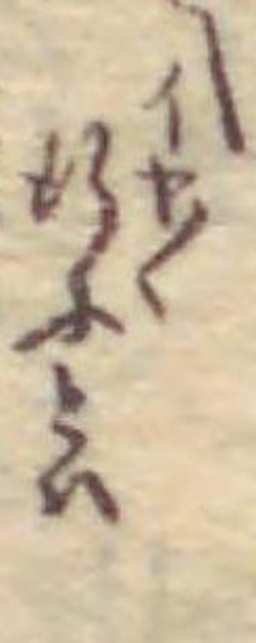行ふとは
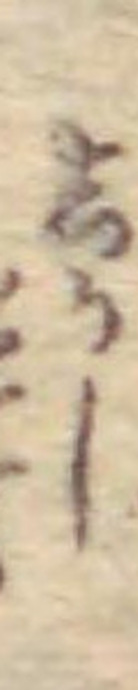しかし
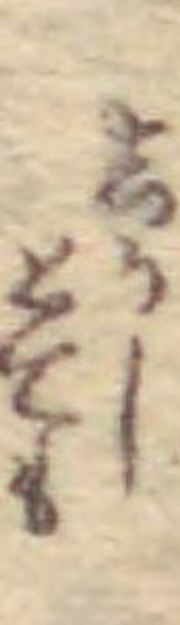しかし
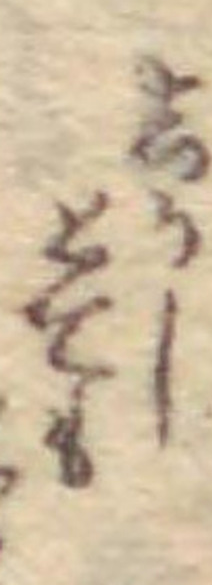とても
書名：心学早染艸 : 3巻
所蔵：国立国会図書館 National Diet Library, JAPAN
